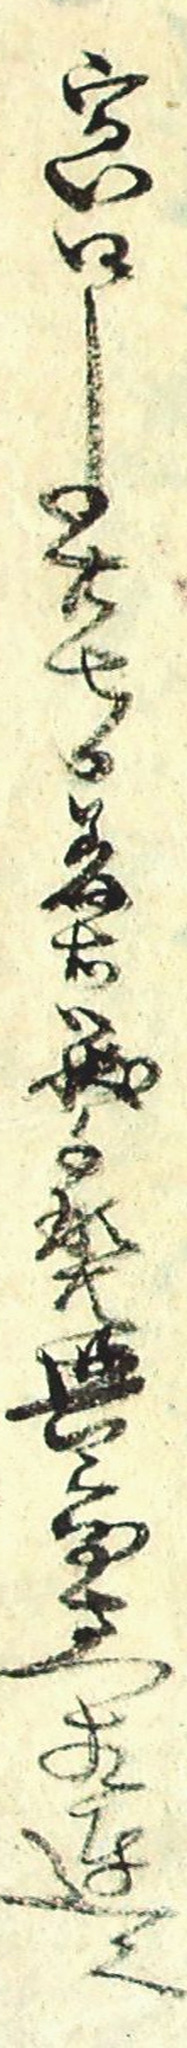寅四月廿七日着右御状手形共与三郎方へ相達候

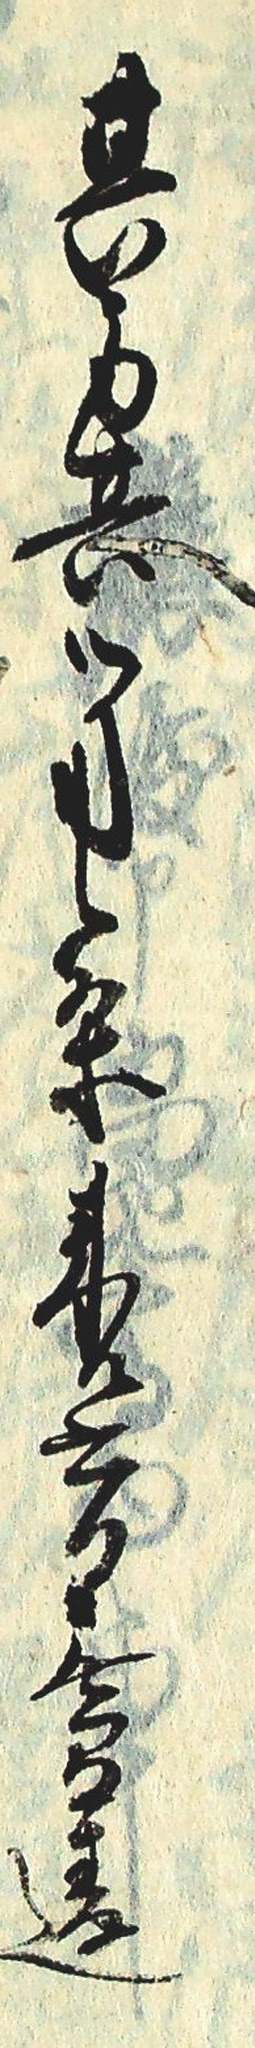其方共御用候条来る六日無間違
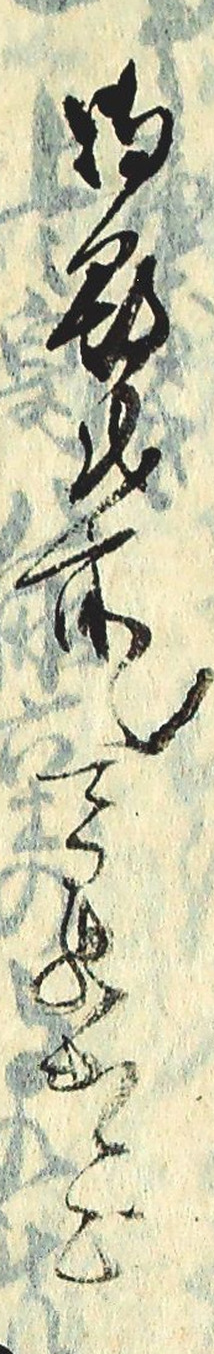御郡代所へ可罷出候以上
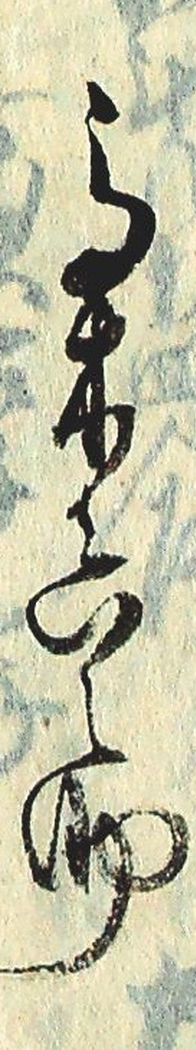高木真之助
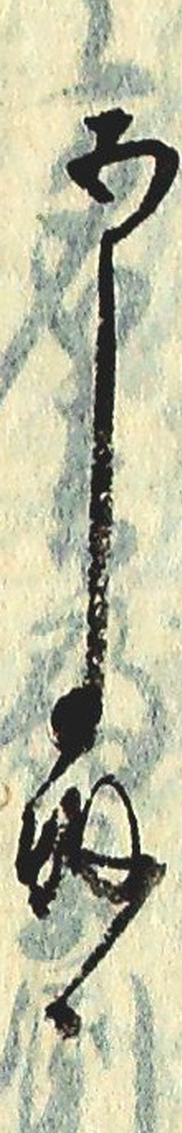五月朔日
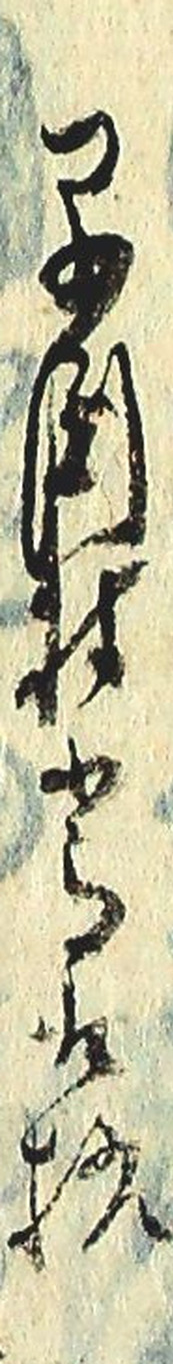早淵村小高取格
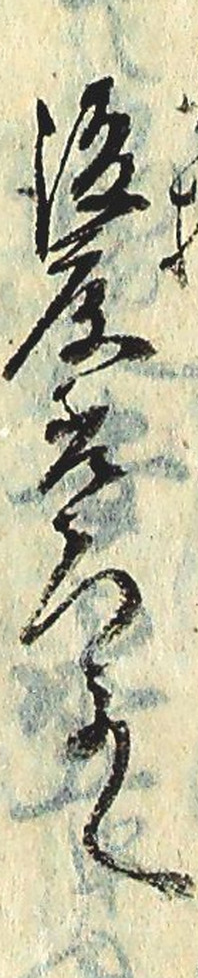後藤善右衛門方へ
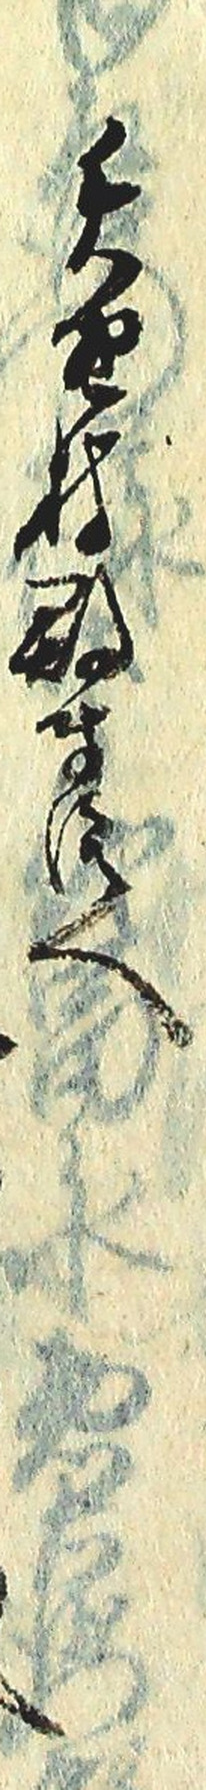矢野村郡付浪人
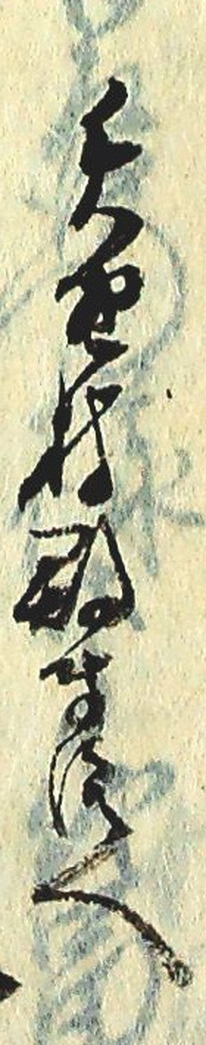矢野村郡付浪人
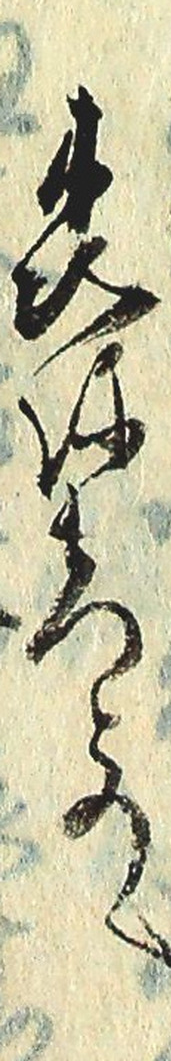森弥右衛門方へ
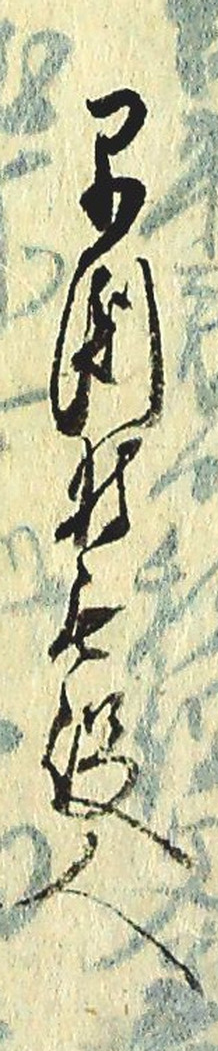早淵村無役人
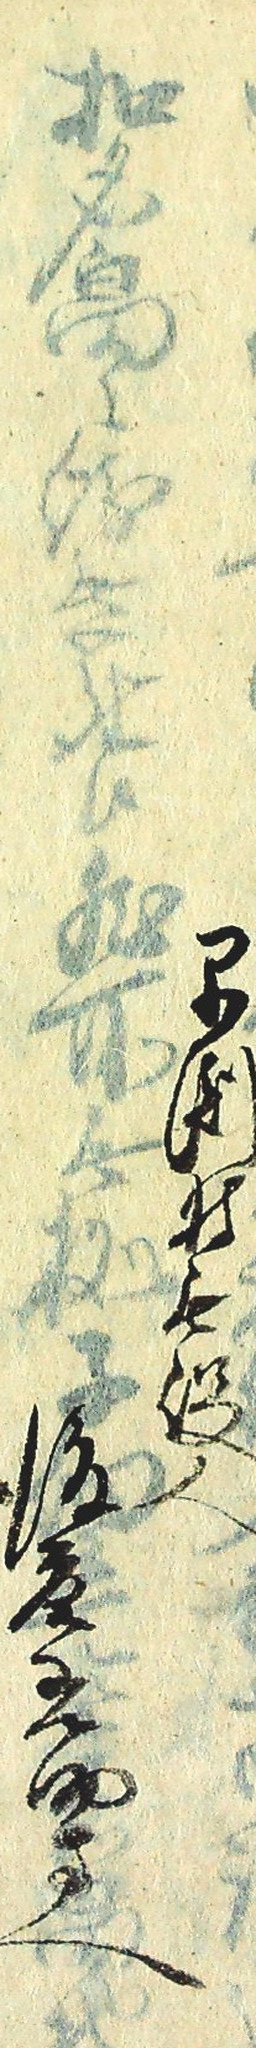後藤善助方へ
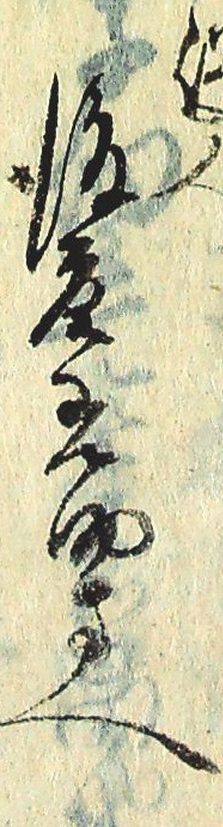後藤善助方へ
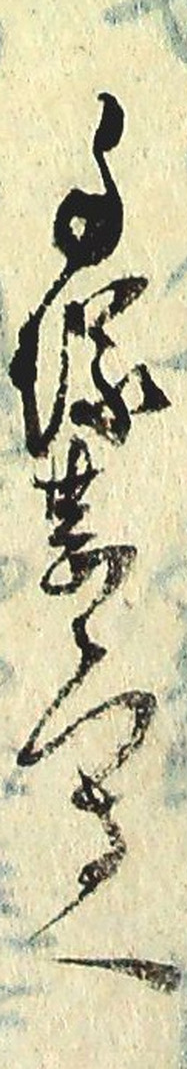手塚甚右衛門方へ
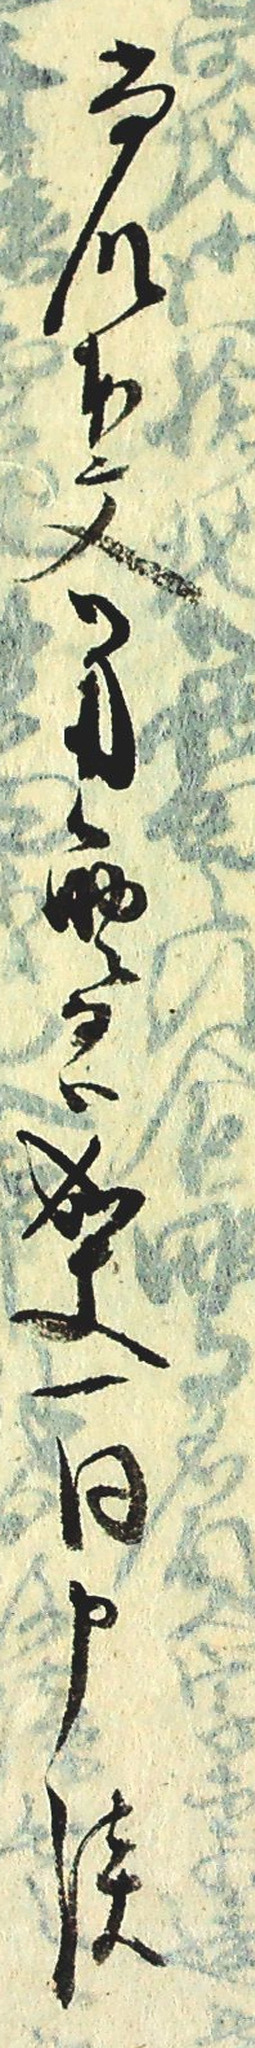尚以本文御用筋にては成丈一同申談
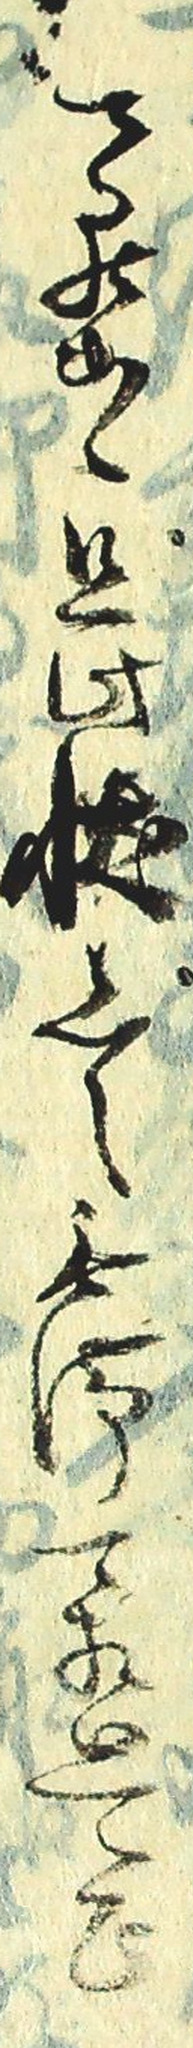可罷出候且此状急々無滞可相廻候以上
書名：諸御願書控(弐番）
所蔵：鳴門教育大学 Naruto University of Education
